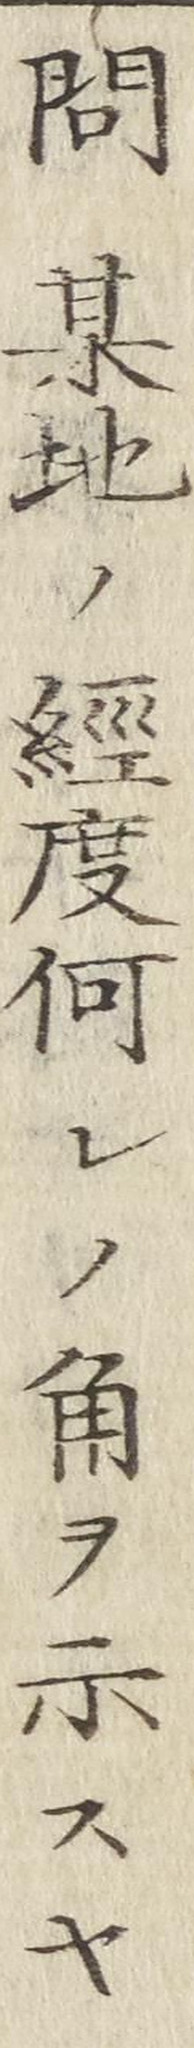問某地ノ経度何レノ角ヲ示スヤ
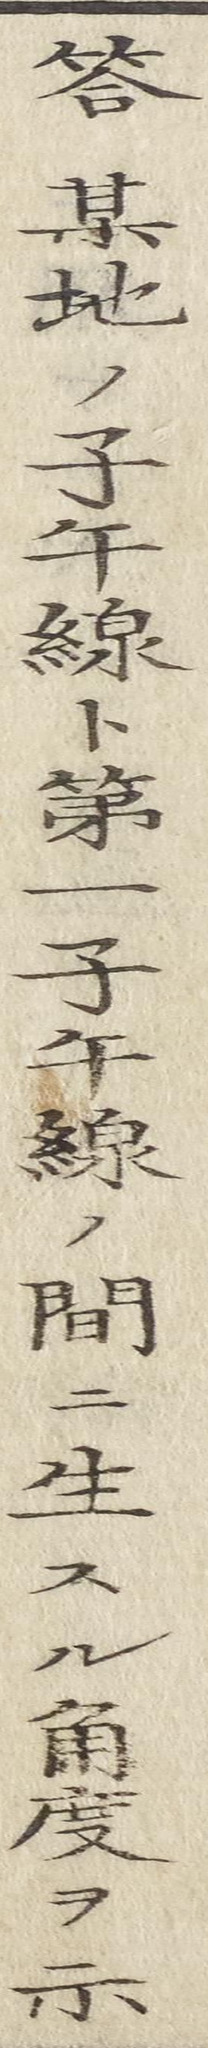答某地ノ子午線ト第一子午線ノ間ニ生スル角度ヲ示
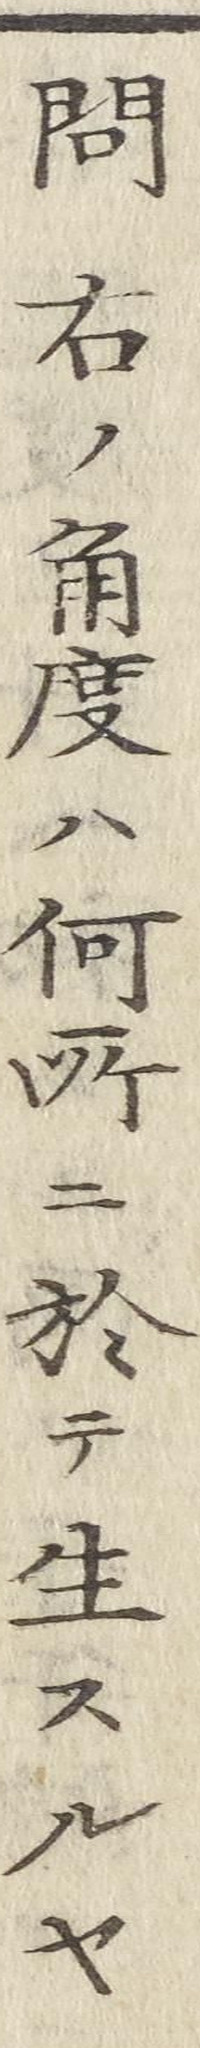問右ノ角度ハ何所ニ於テ生スルヤ
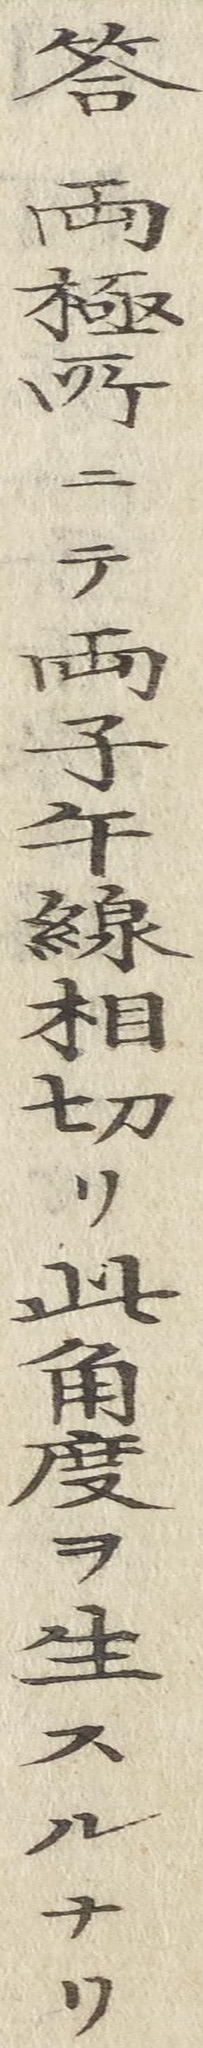答両極所ニテ両子午線相切リ此角度ヲ生スルナリ
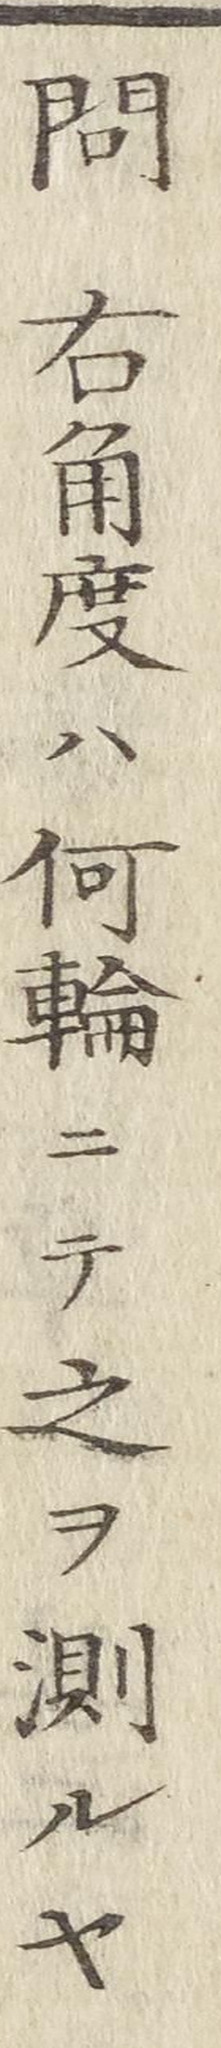問右角度ハ何輪ニテ之ヲ測ルヤ
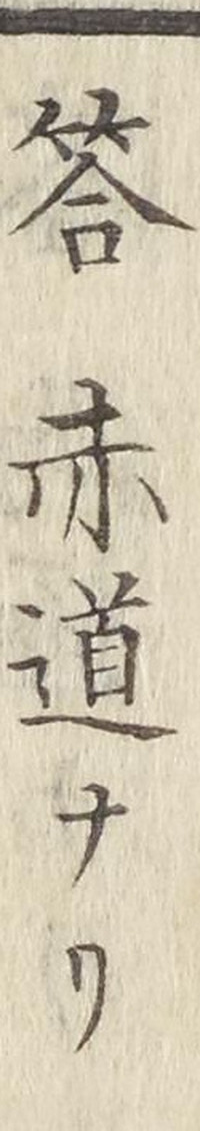答赤道ナリ
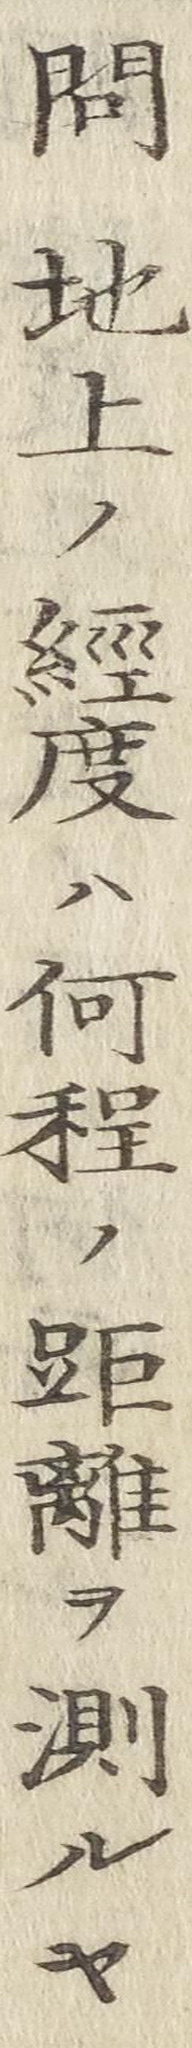問地上ノ経度ハ何程ノ距離ヲ測ルヤ
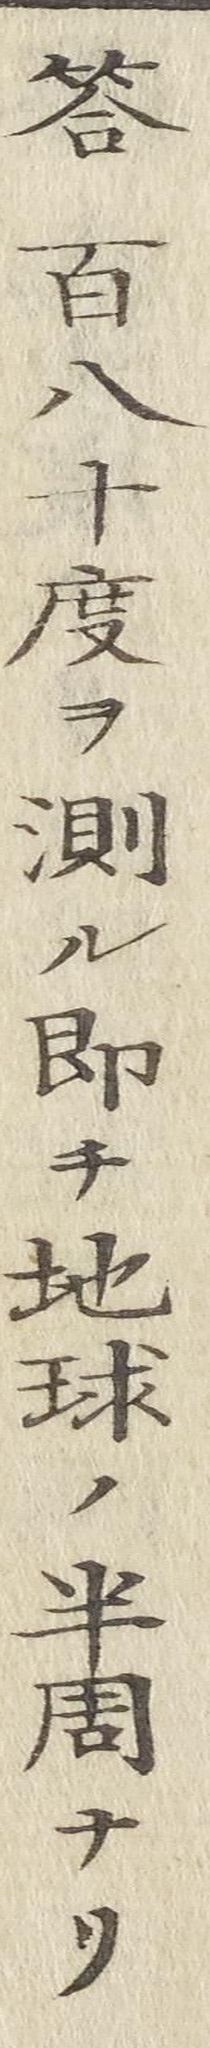答百八十度ヲ測ル即チ地球ノ半周ナリ
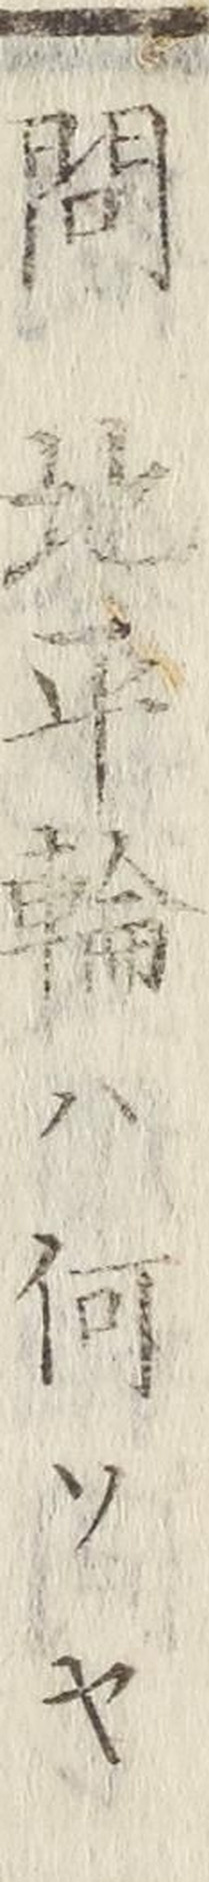問地平輪ハ何ソヤ
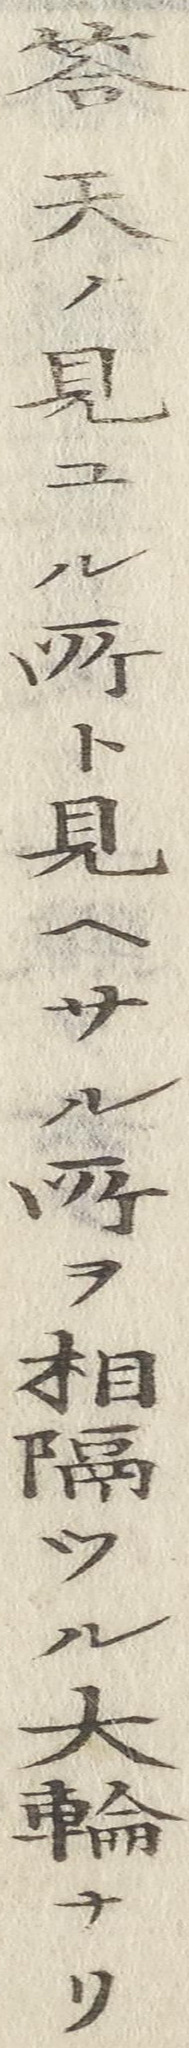答天ノ見ユル所ト見ヘサル所ヲ相隔ツル大輪ナリ
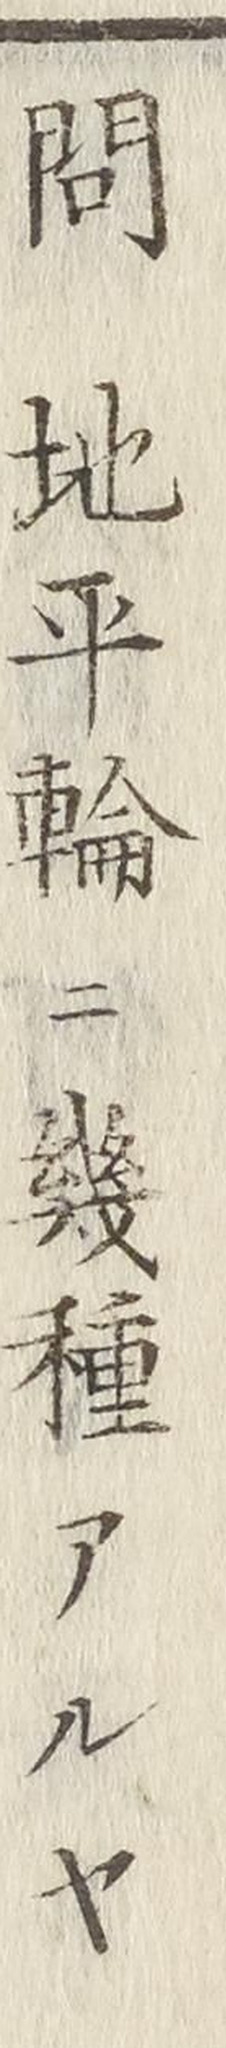問地平輪ニ幾種アルヤ
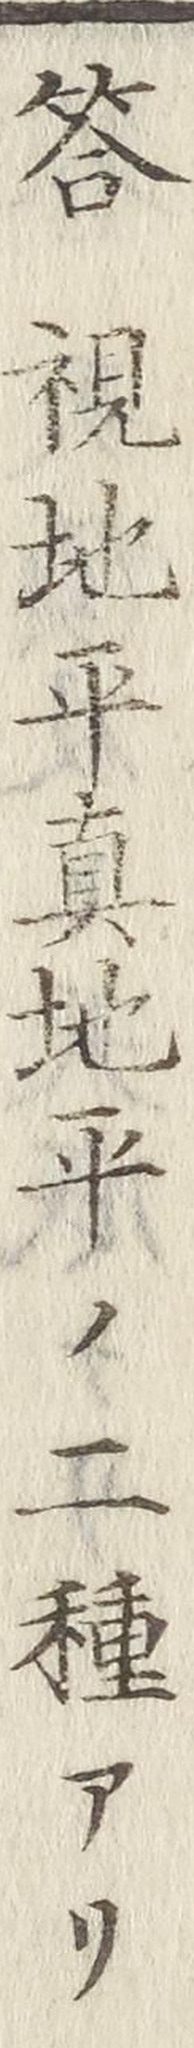答視地平真地平ノ二種アリ
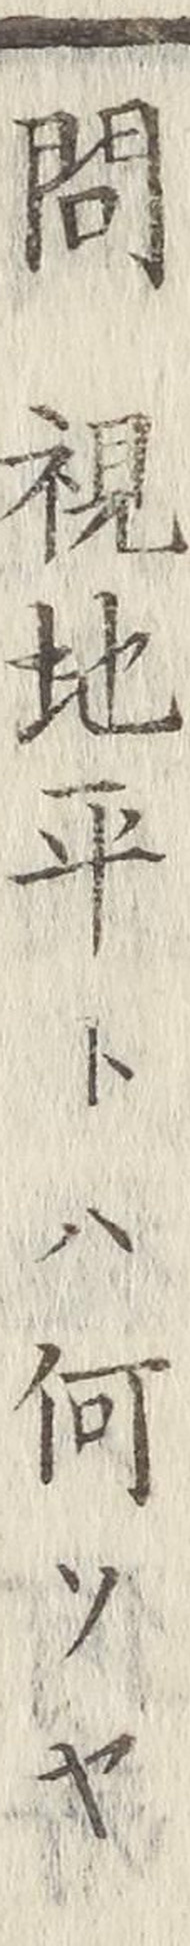問視地平トハ何ソヤ
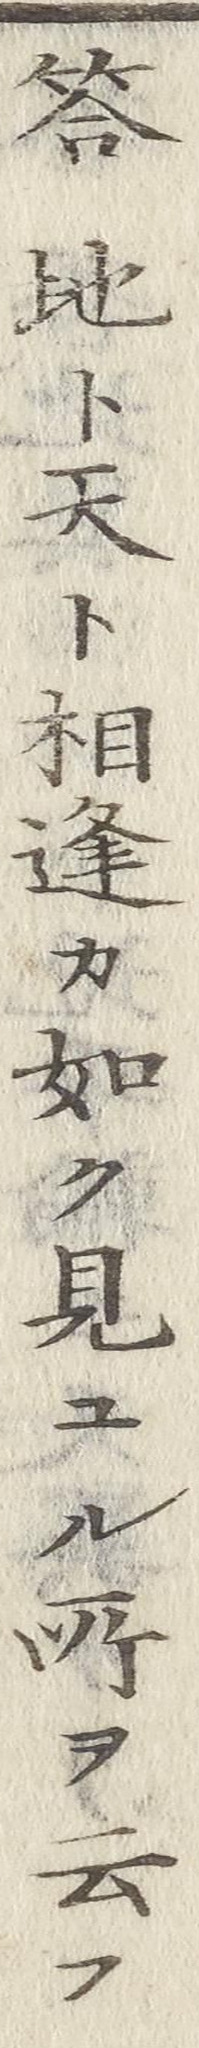答地ト天ト相逢カ如ク見ユル所ヲ云フ
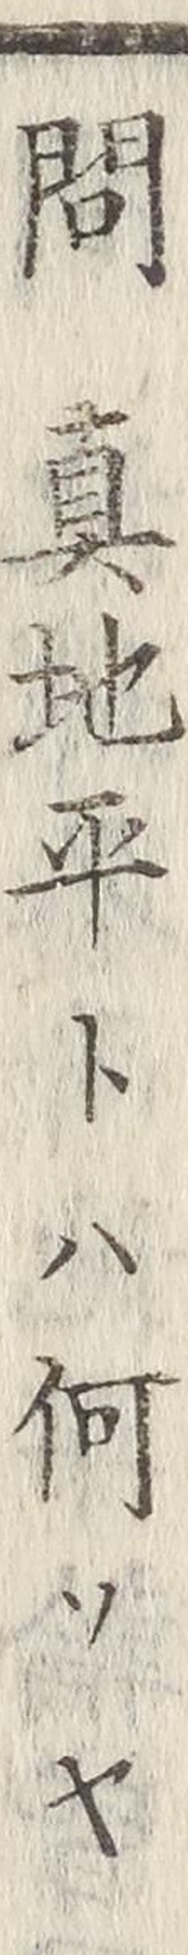問真地平トハ何ソヤ
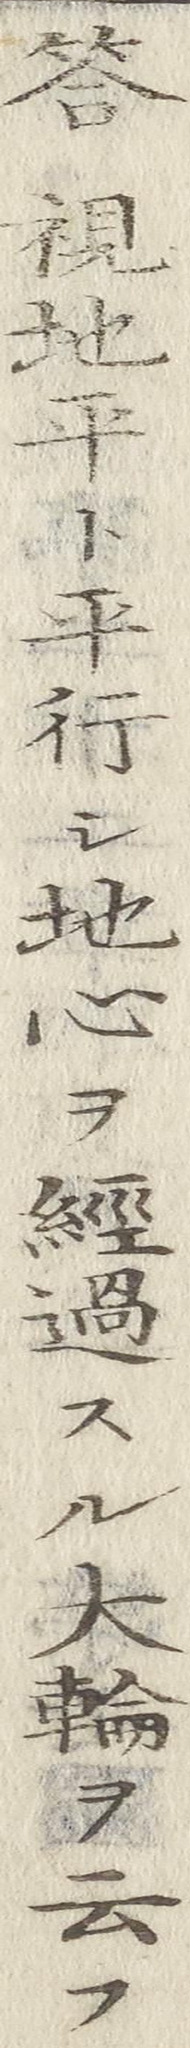答視地平ト平行シ地心ヲ経過スル大輪ヲ云フ
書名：星学圖説　上
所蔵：東京大学地震研究所図書室 Earthquake Research Institute Library, The University of Tokyo, JAPAN
